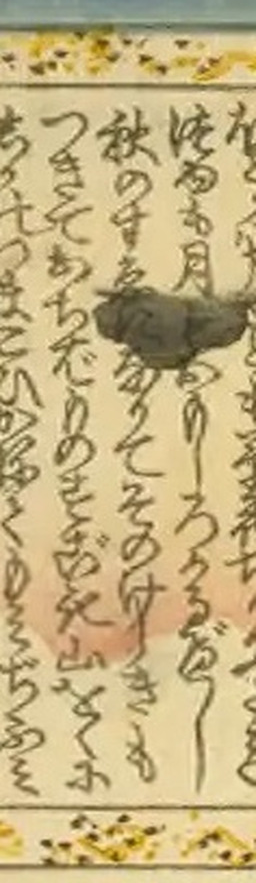秋のすゑになりてそのけしきも
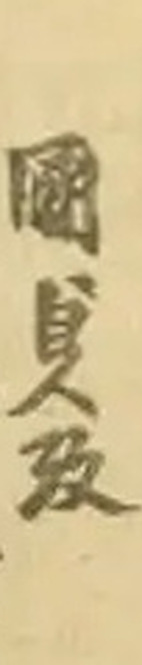国貞改
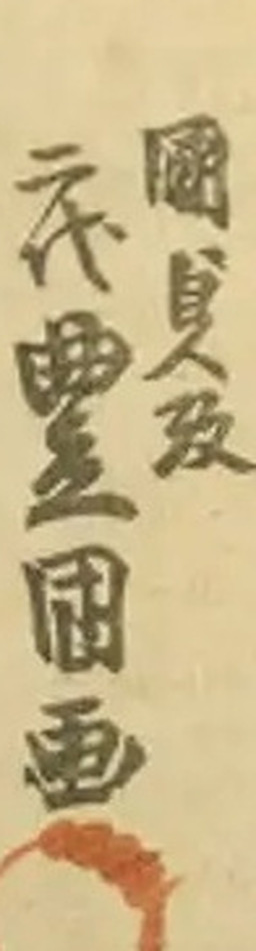二代豊国画
